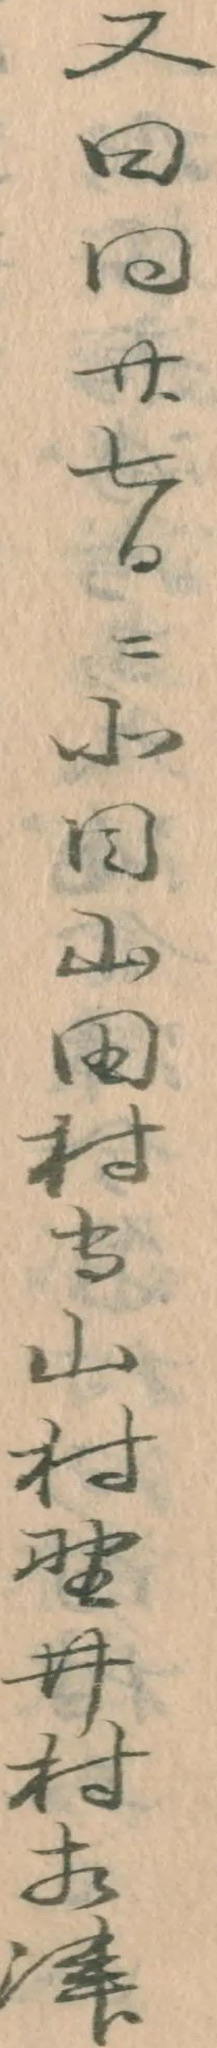又曰同廿七日に北目山田村守山村野井村相津
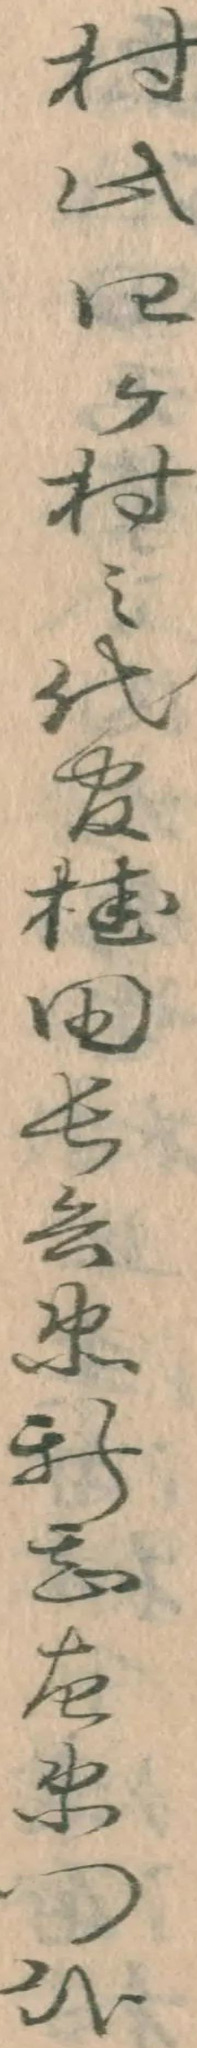村此四け村之代官桂田長兵衛新甚左衛門弐
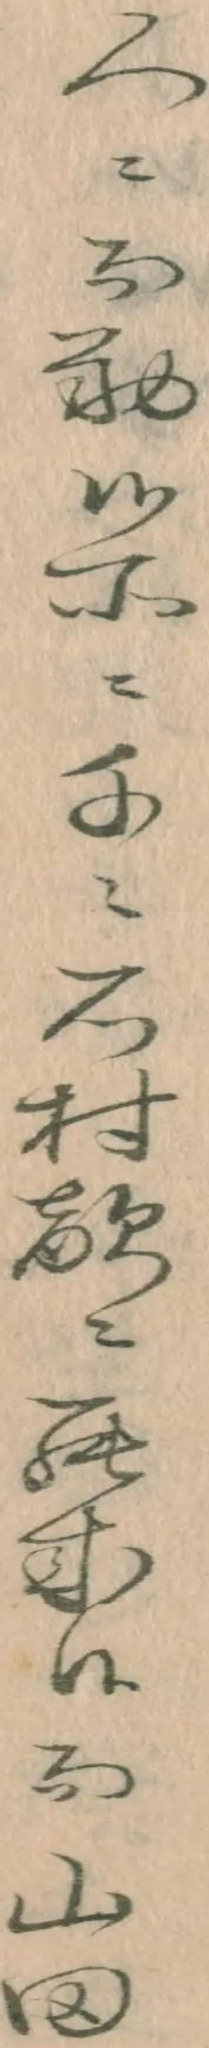人に而勤候所に千々石村敵に罷成候而山田
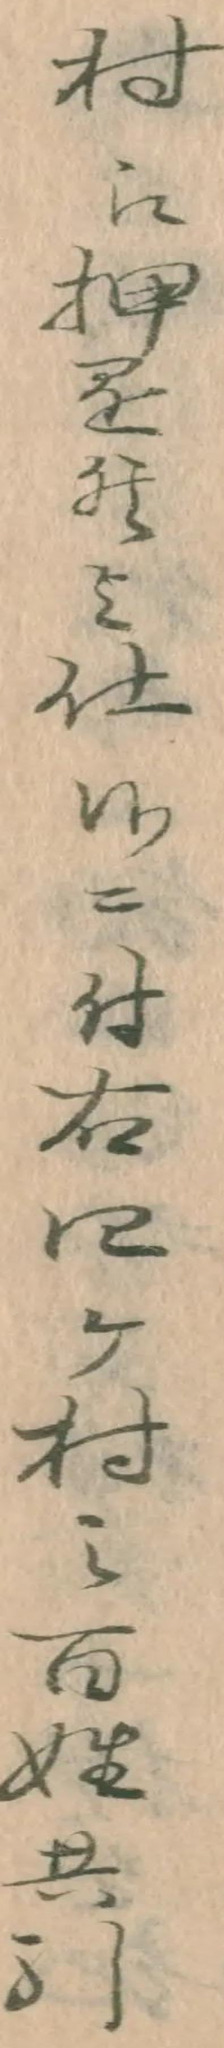村江押懸候与仕候に付右四け村之百姓共引
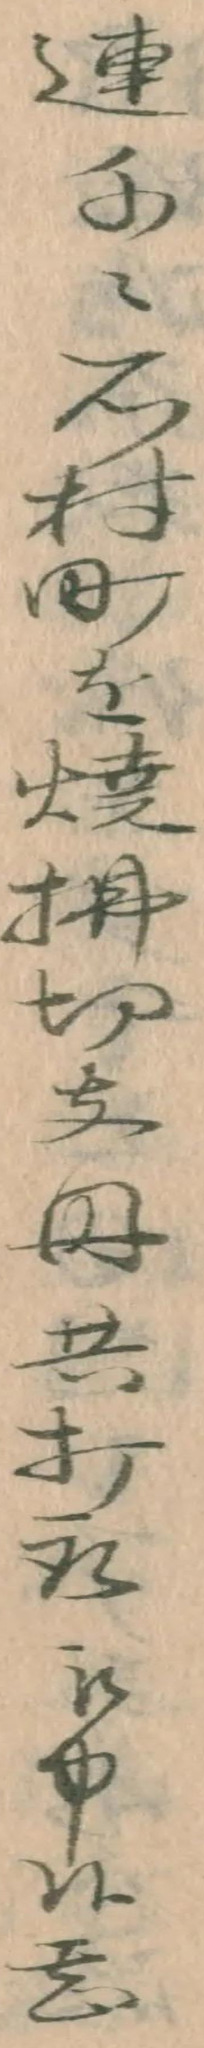連千々石村町を焼払切支丹共打取被申候甚
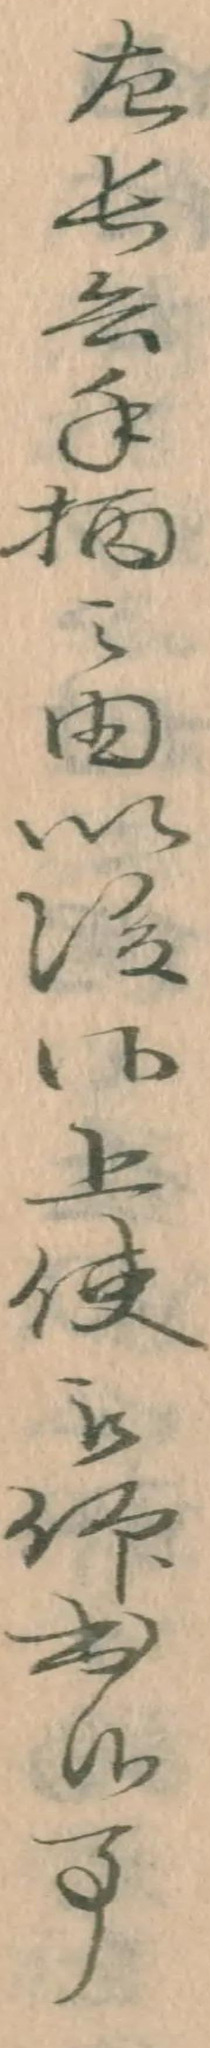左長兵衛手柄之由以後御上使江仰出候事
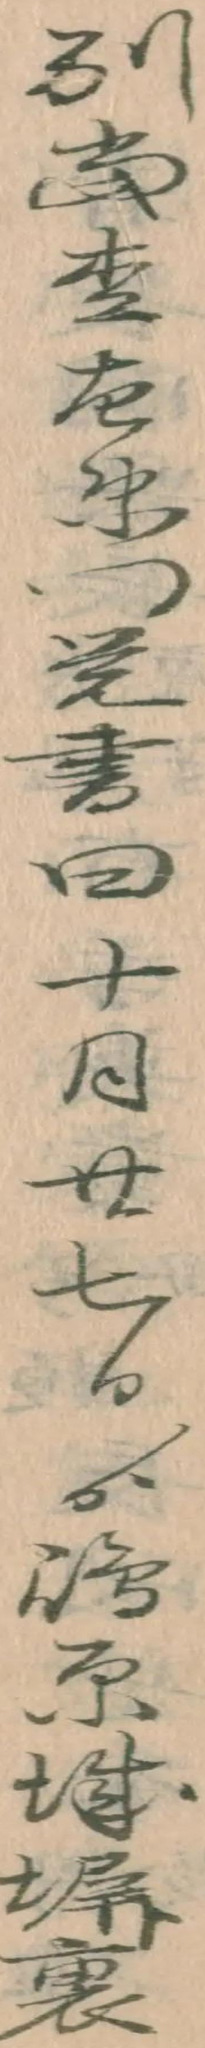別当杢左衛門覚書曰十月廿七日ゟ島原城塀裏
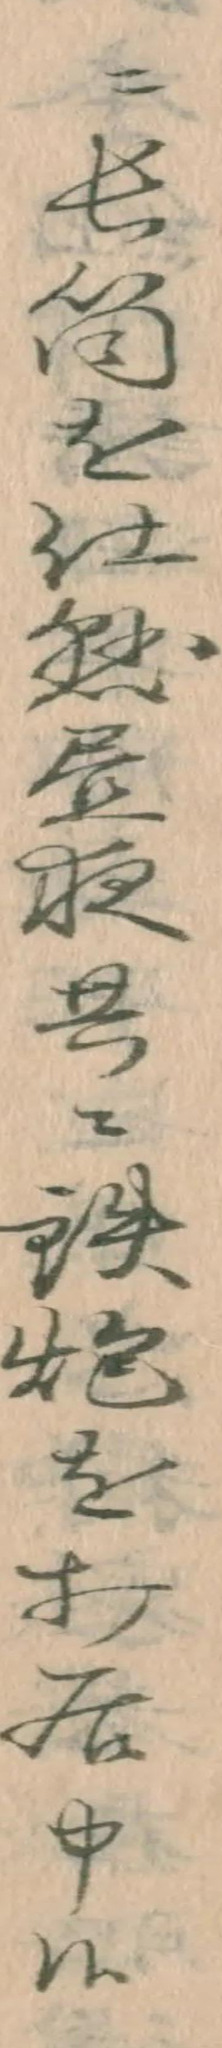に長筒を仕懸昼夜共に鉄炮を打居申候
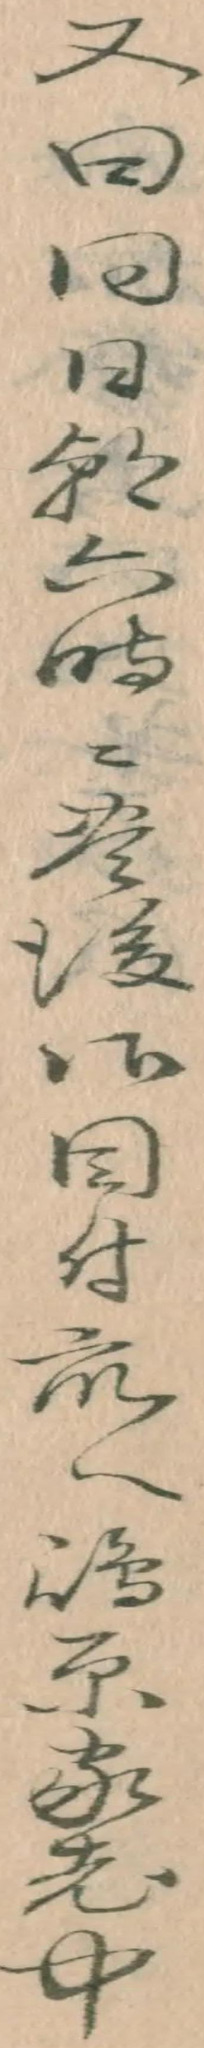又曰同日朝六時に豊後御目付衆へ島原家老中
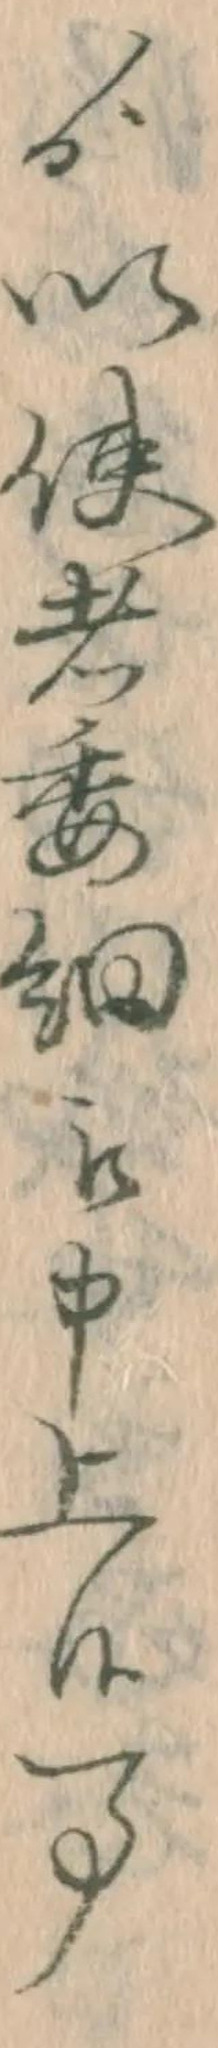ゟ以使者委細江申上候事
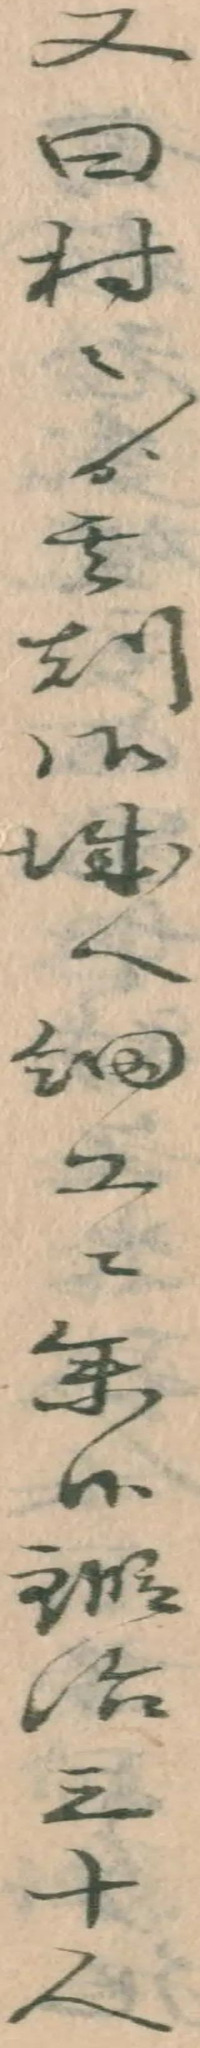又曰村々ゟ其刻御城へ細工に参候鍛冶三十人
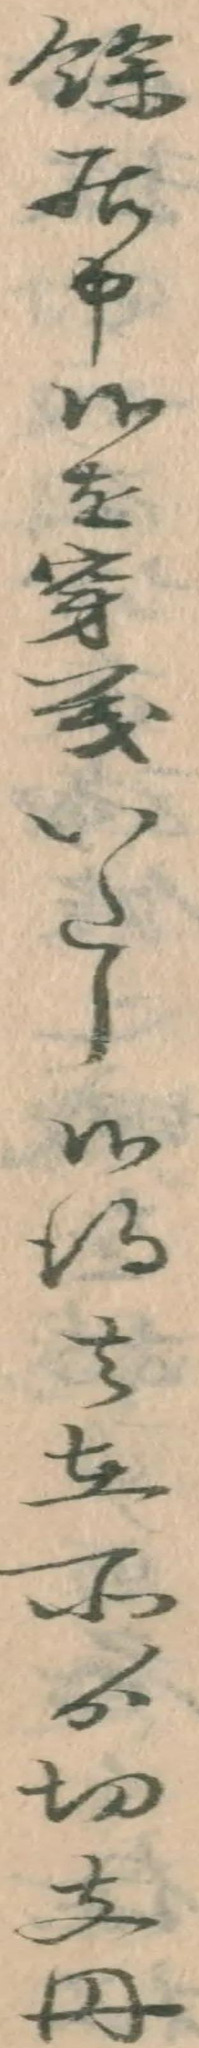余居申候を穿義いたし候得者在所ゟ切支丹
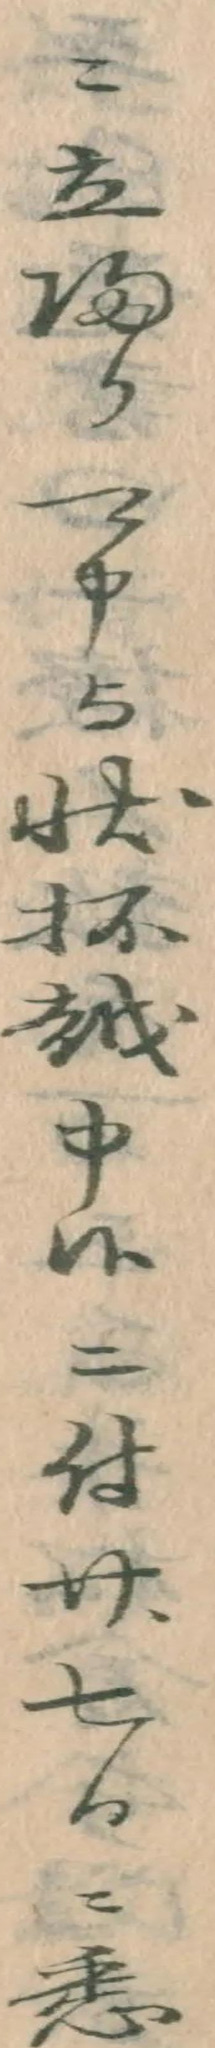に立帰り可申と状杯越申候に付廿七日に悉
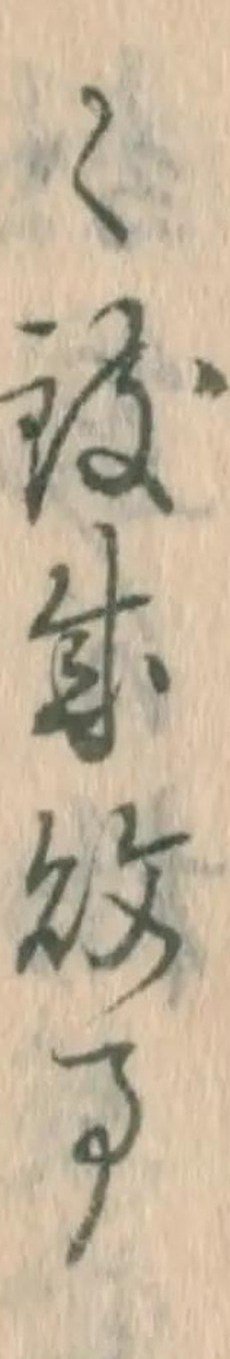く致成放事
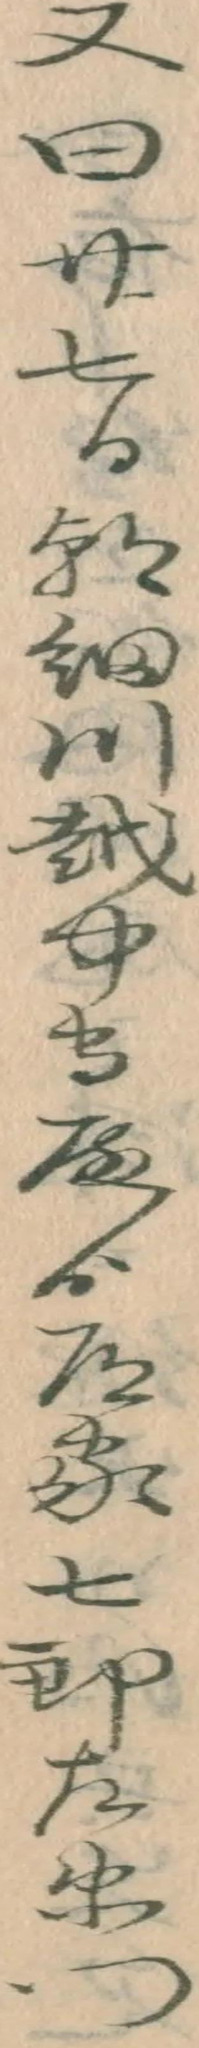又曰廿七日朝細川越中守殿ゟ道家七郎左衛門
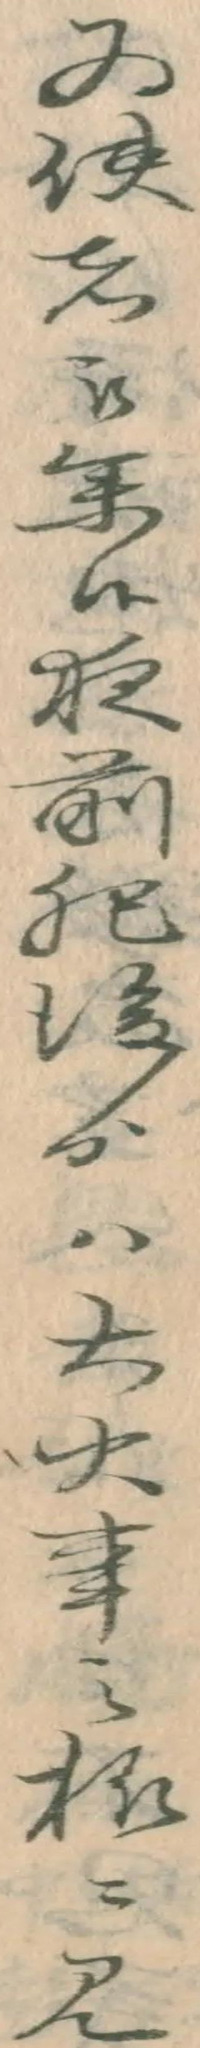為使者江参候夜前肥後ゟは大火事之様に見
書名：切支丹御退治記 49巻. [2]
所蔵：国立国会図書館 National Diet Library, JAPAN
